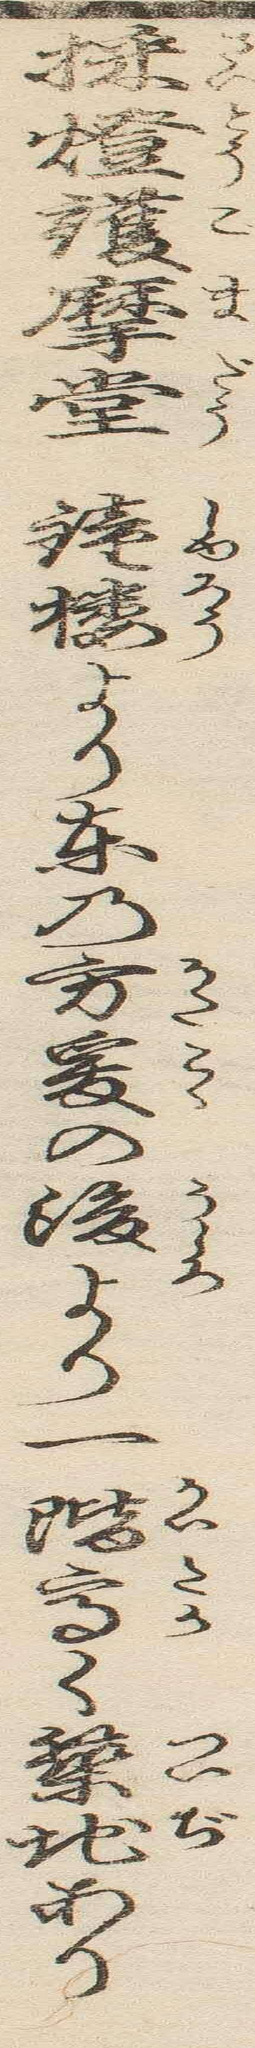採燈護摩堂鐘楼より東の方爰の後より一階高く築地あり
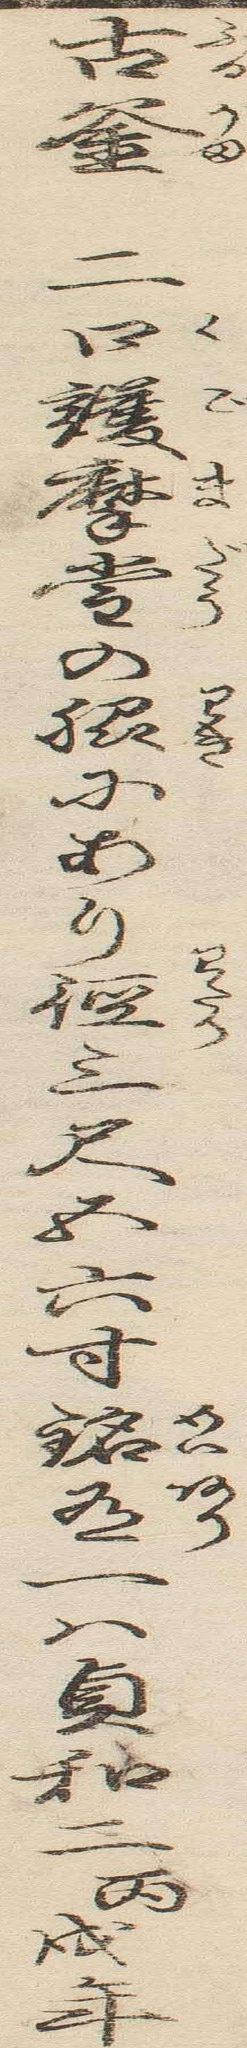古釜二口護摩堂の脇にあり徑三尺五六寸銘有一は貞和二丙戌年
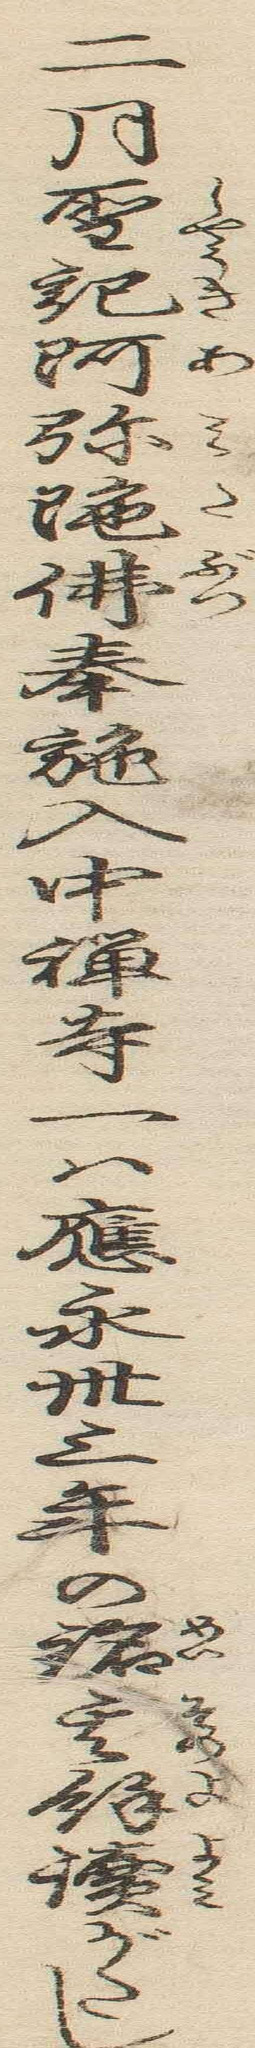二月聖記阿弥陀佛奉施入中禅寺一は應永卅三年の銘其餘讀がたし
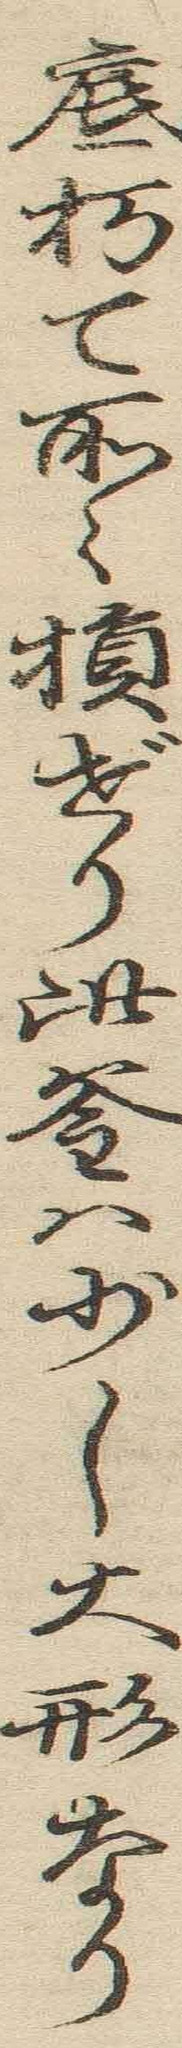底朽て所〻損ぜり此釜は少し大形なり

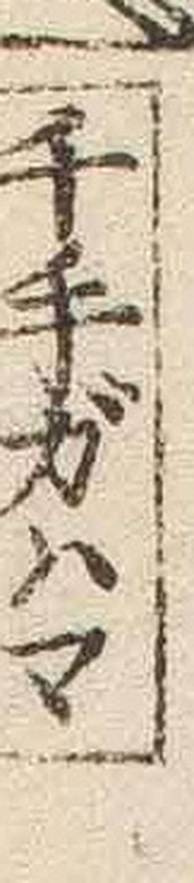千手ガハマ
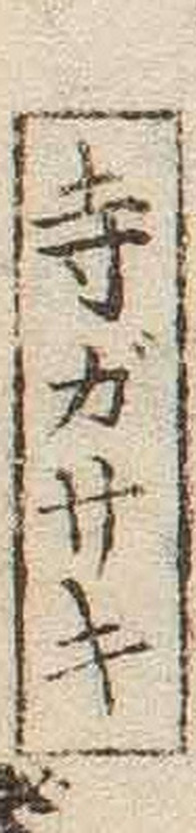寺ガサキ
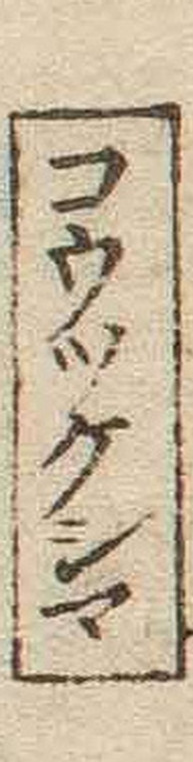コウツケシマ

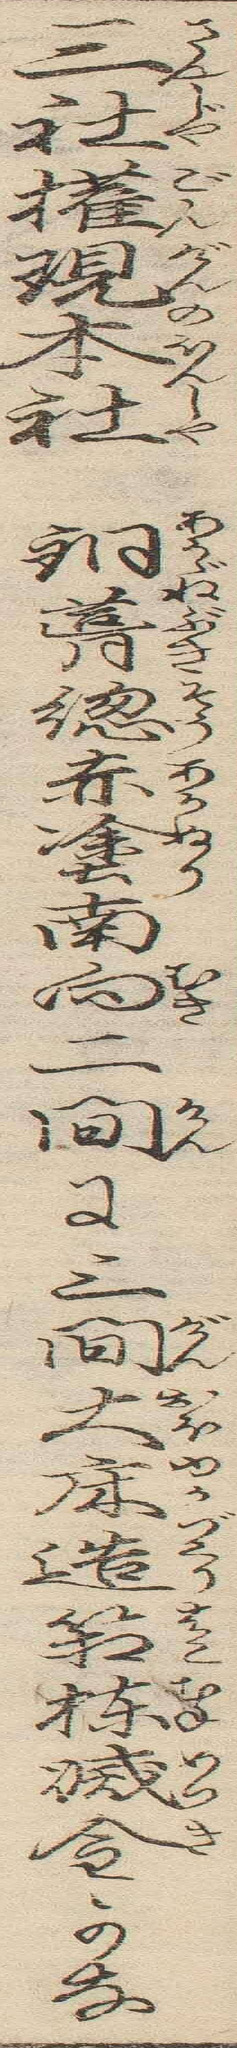三社權現本社銅葺緫赤塗南向二間に三間大床造箱棟滅金かな
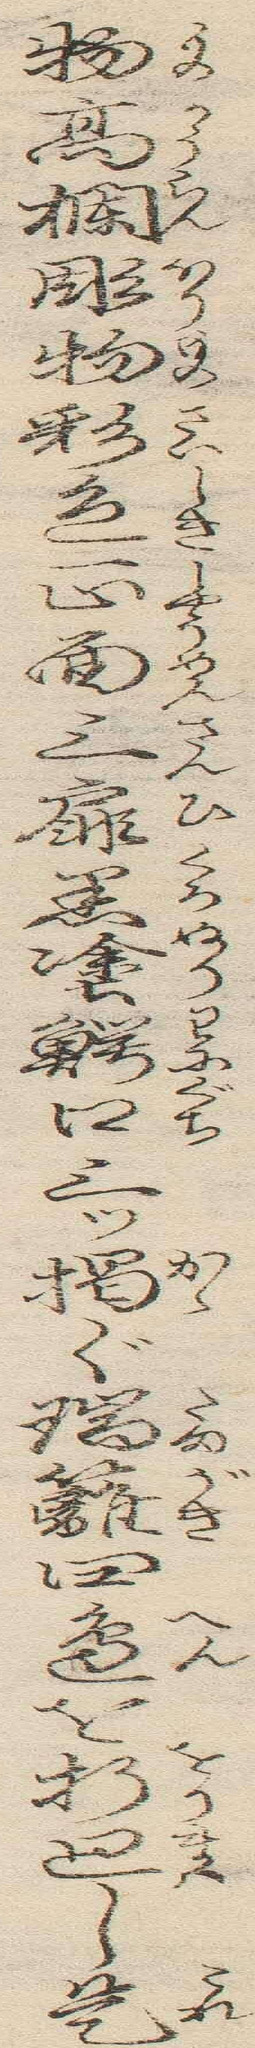物高欄彫物彩色正面三扉黒塗鰐口三ッ掲ぐ瑞籬四邊を折廻し是
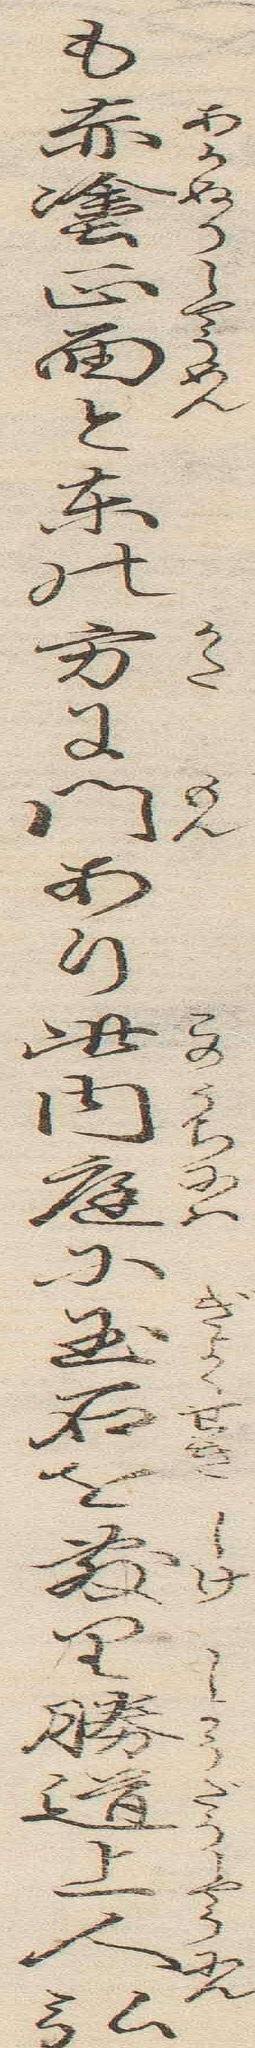も赤塗正面と東の方に門あり此内庭に玉石を敷り勝道上人弘
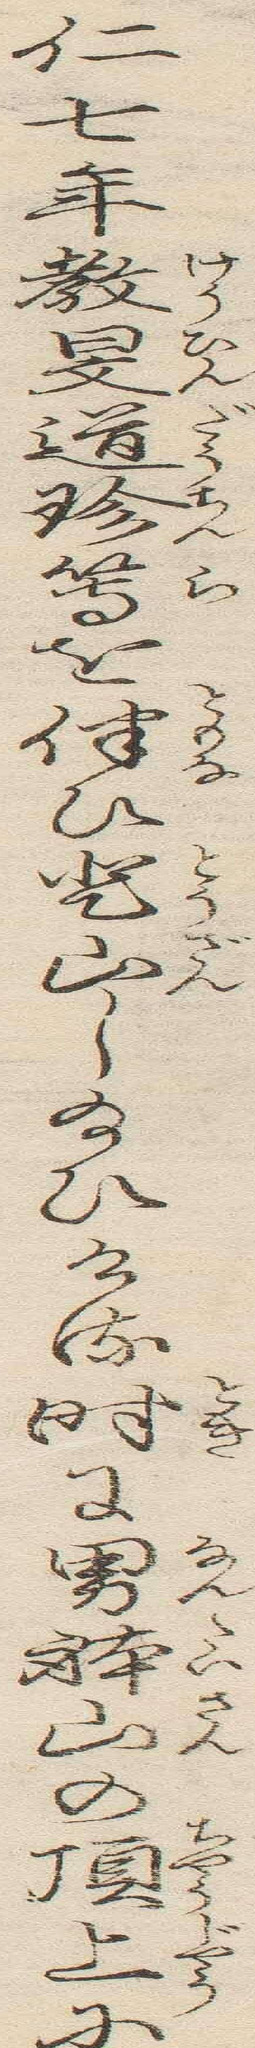任七年敎旻道珍等を伴ひ登山し給ひける时に男躰山の頂上に
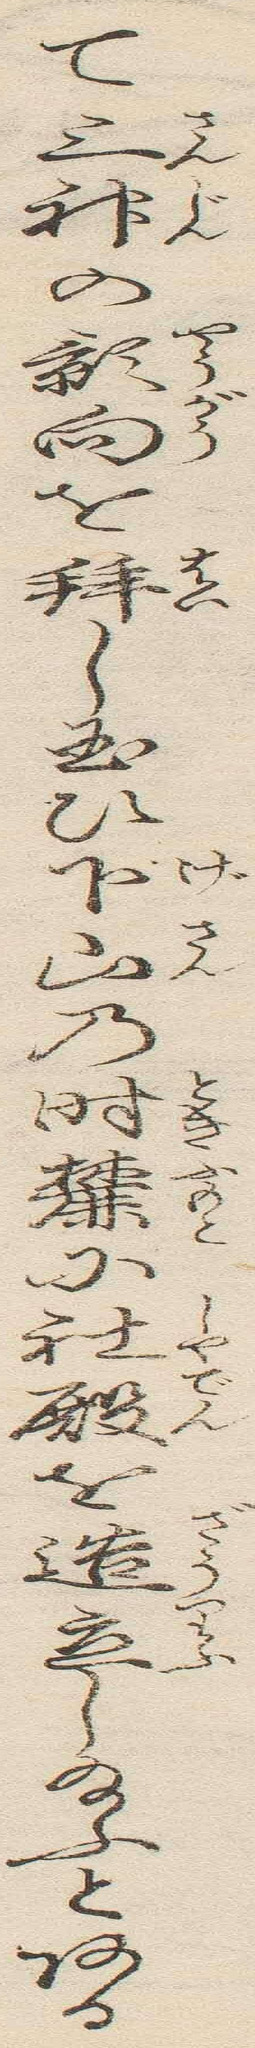て三神の影向を拜し玉ひ下山の时麓に社殿を造立し給ふとある
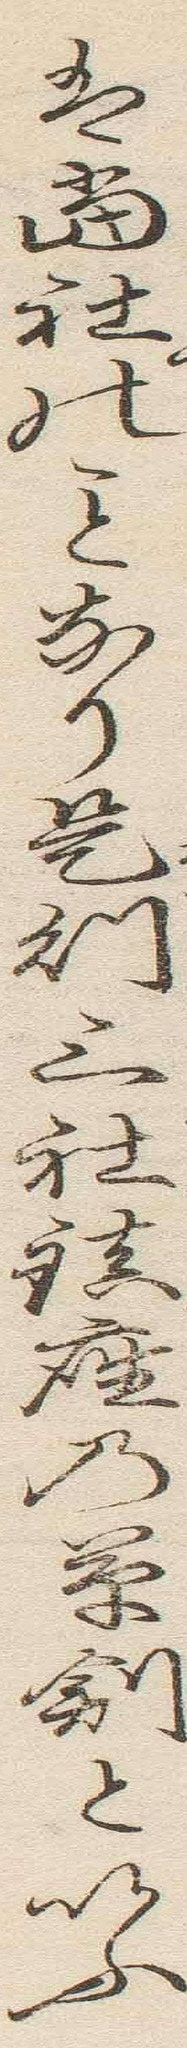は當社のことなり是則三社鎮座の草創といふ
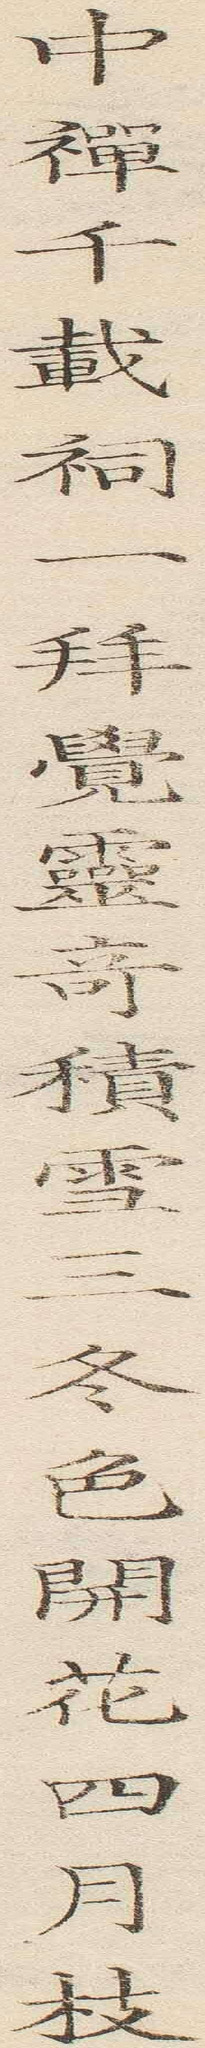中禪千載祠一拜覺靈竒積雪三冬色開花四月枝
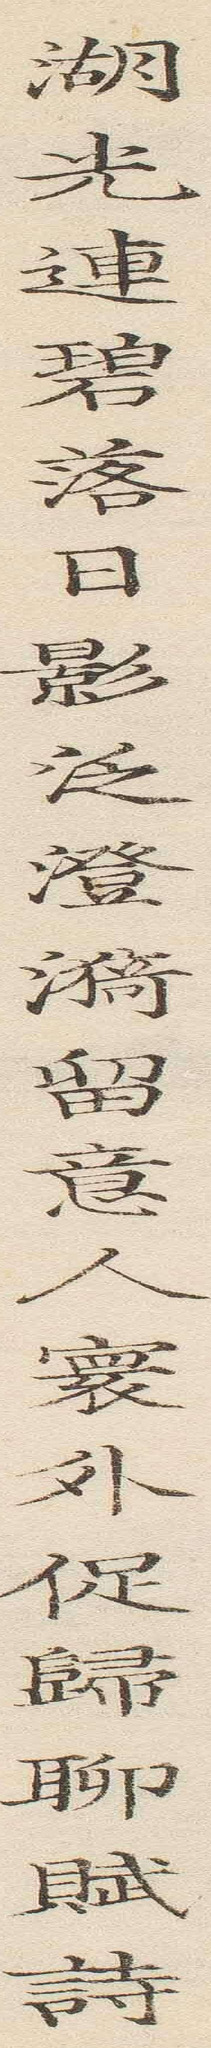湖光連碧落日影泛澄漪留意人𡩲外促歸聊賦詩
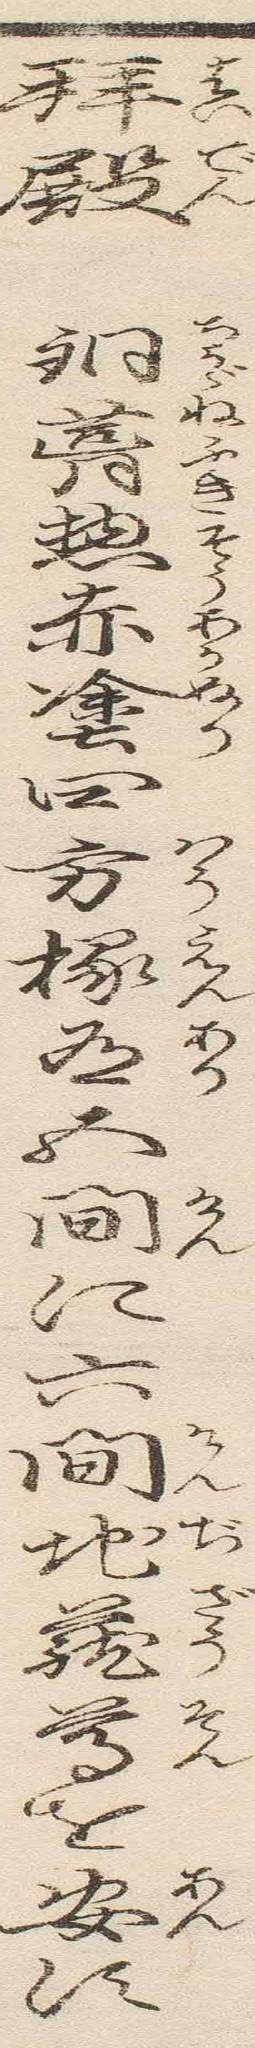拜殿銅葺惣赤塗四方掾有五間に六間地蔵尊を安す
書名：日光山志
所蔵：東京学芸大学附属図書館 国文学研究資料館
